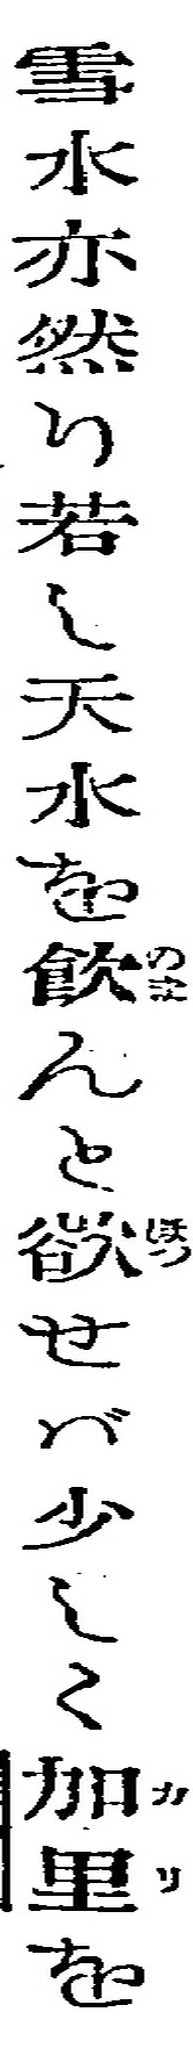雪水亦然り若し天水を飲んと欲せば少しく加里を
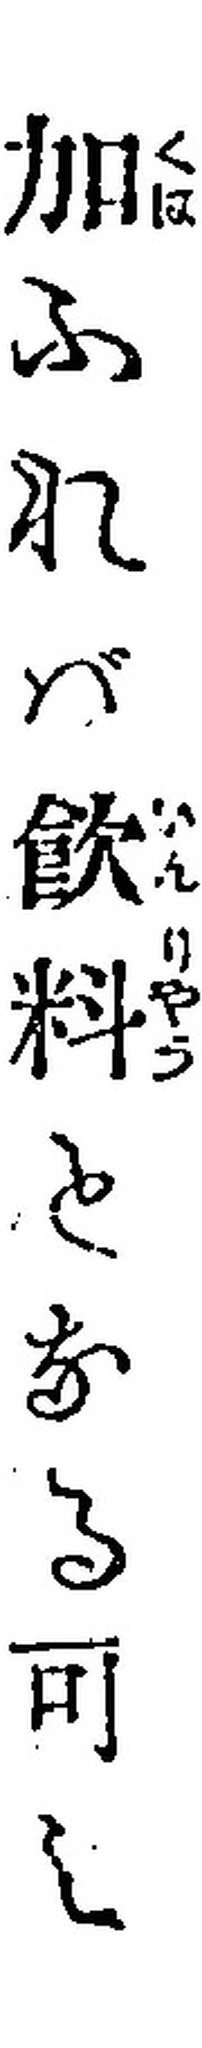加ふれば飲料となる可し
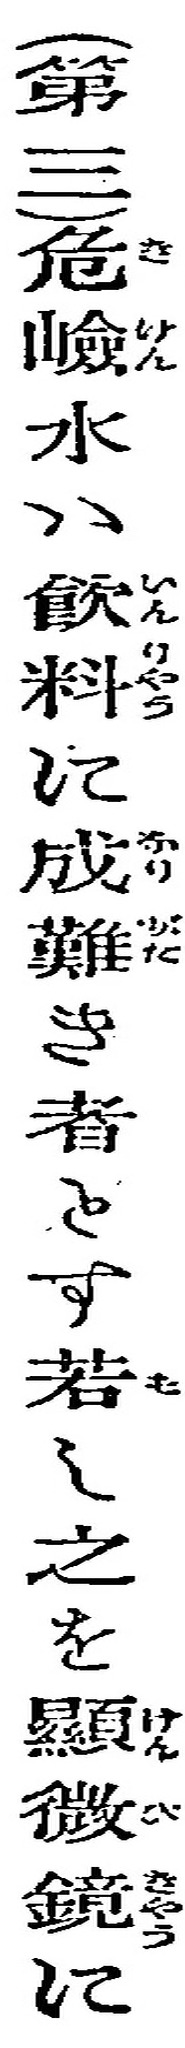[第三]危嶮水は飲料に成難き者とす若し之を顕微鏡に
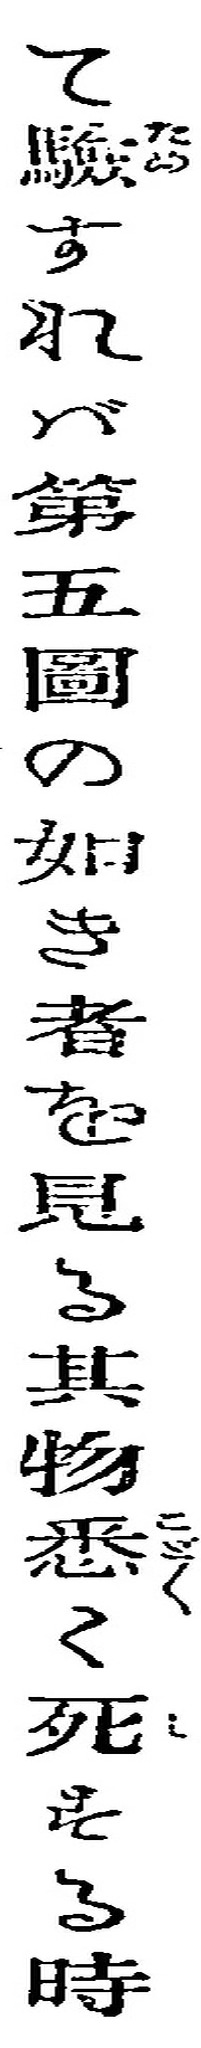て験すれば第五圖の如き者を見る其物悉く死する時
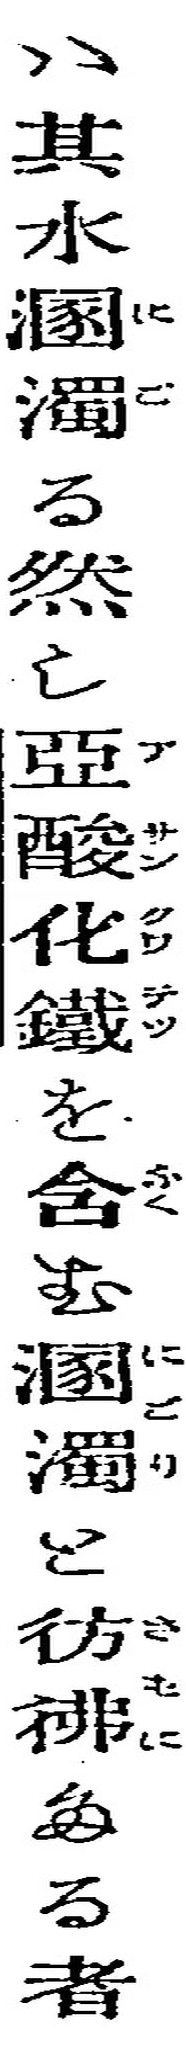は其水溷濁る然し亜酸化鐵を含む溷濁と彷彿たる者
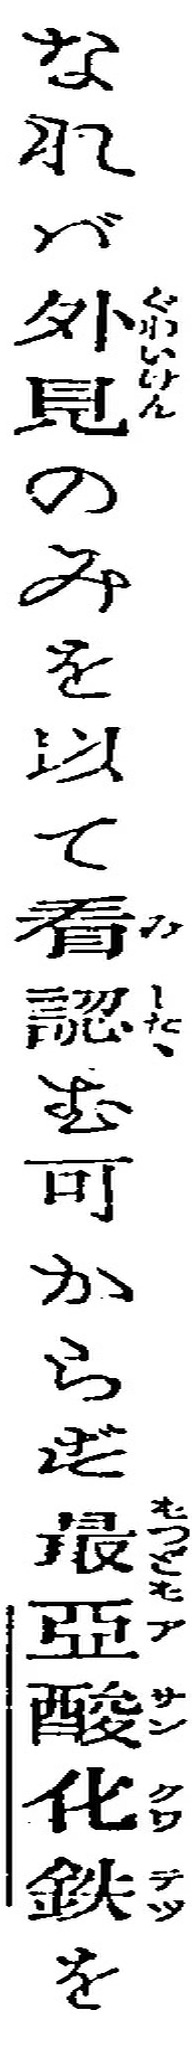なれば外見のみを以て看認む可からず最亜酸化鉄を
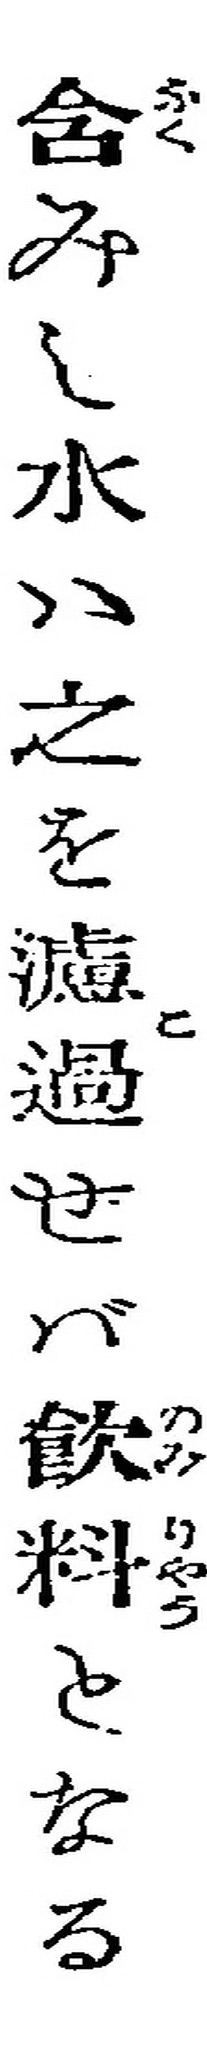含みし水は之を濾過せば飲料となる
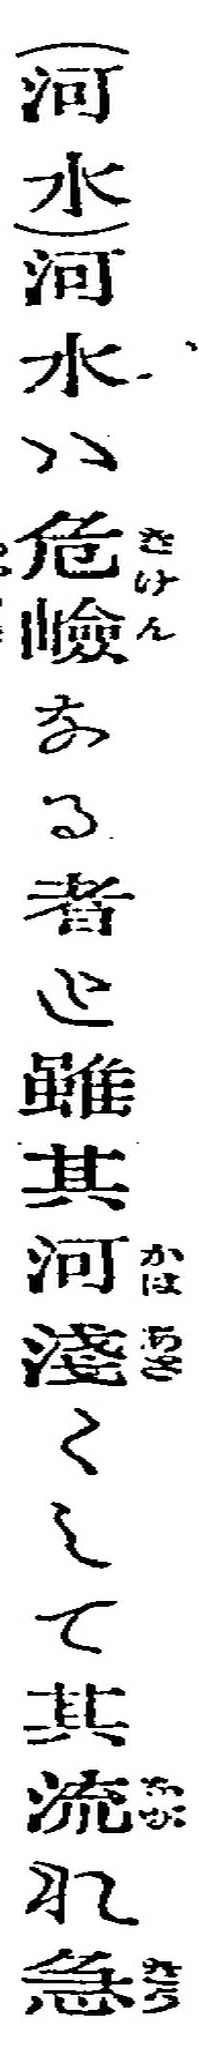[河水]河水は危嶮なる者と雖其河浅しくして其流れ急
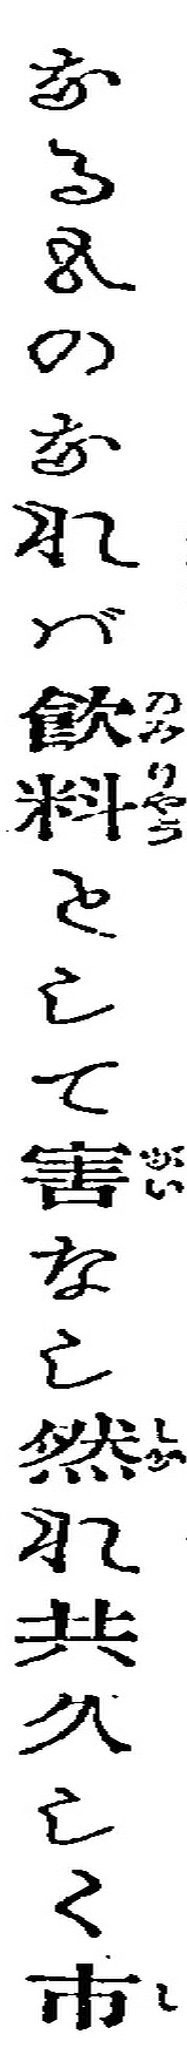なるものなれば飲料として害なし然れ共久しく市

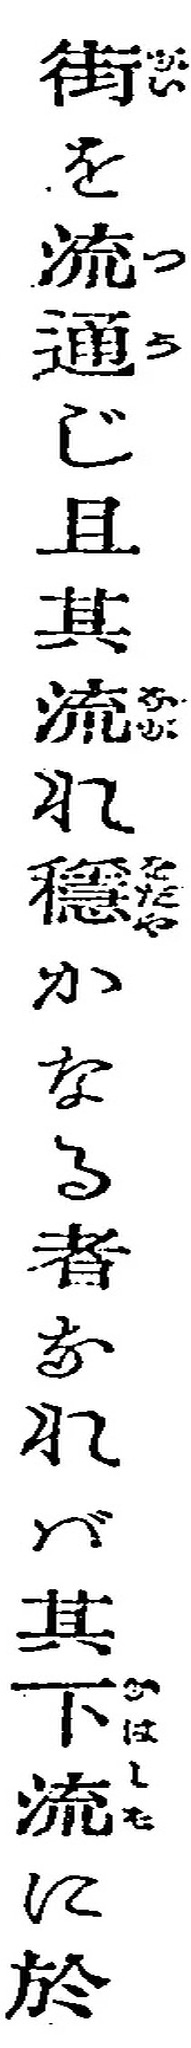街を流通じ且其流れ穏かなる者なれば其下流に於
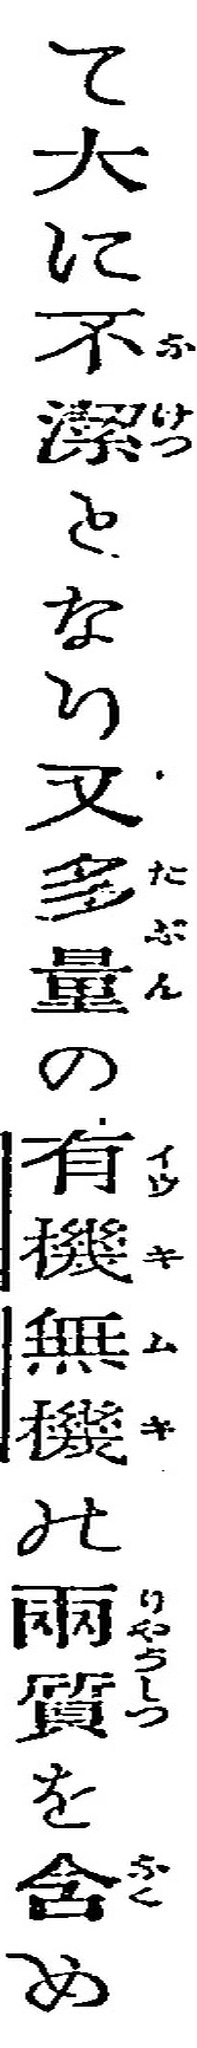て大に不潔となり又多量の有機無機の両質を含め
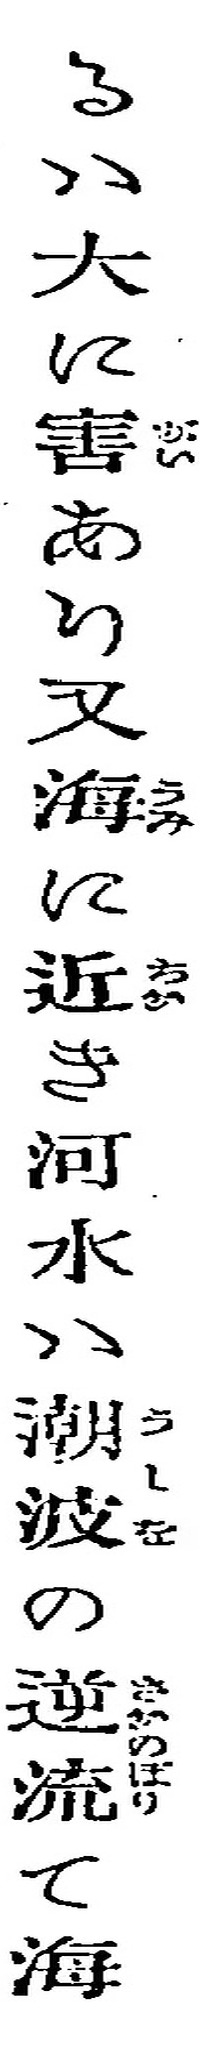るは大に害あり又海に近き河水は潮波の逆流て海
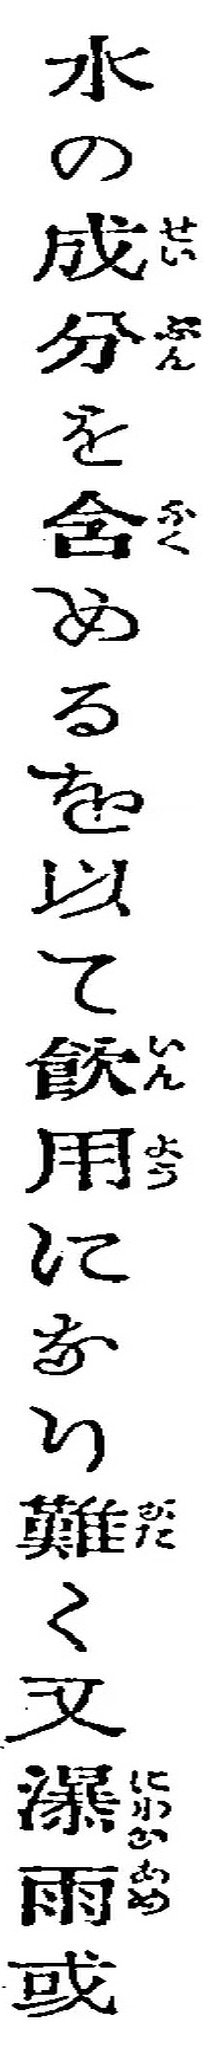水の成分を含めるを以て飲用になり難く又瀑雨或
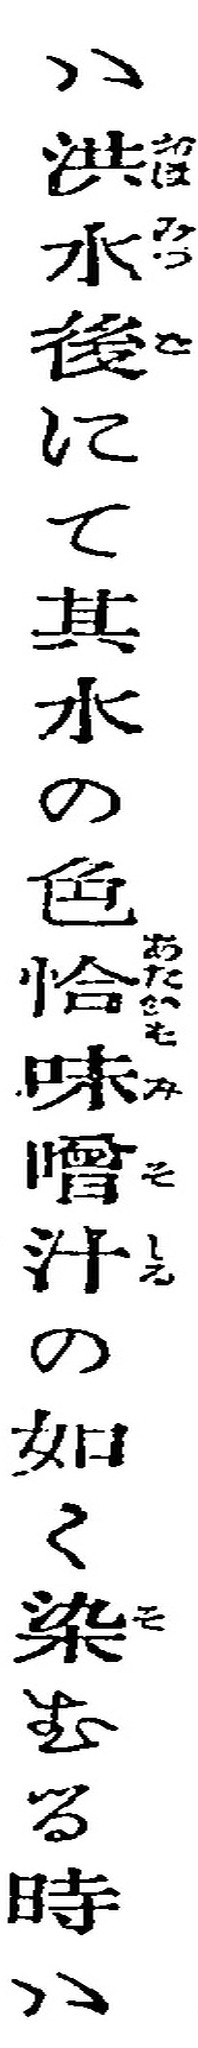は洪水後にて其水の色恰味噌汁の如く染むる時は
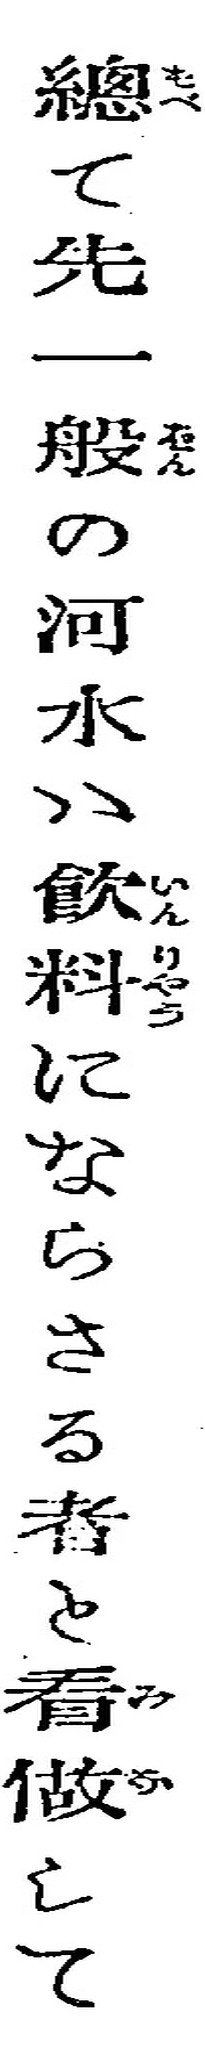総て先一般の河水は飲料にならさる者と看做して
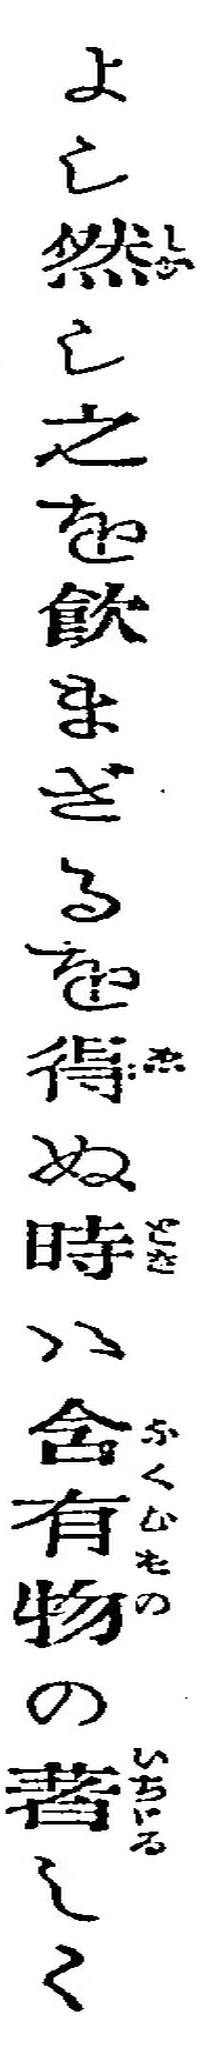よし然し之を飲まざるを得ぬ時は含有物の著しく
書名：飲水の心得 : 伝染病の予防
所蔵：国立国会図書館 National Diet Library, JAPAN
